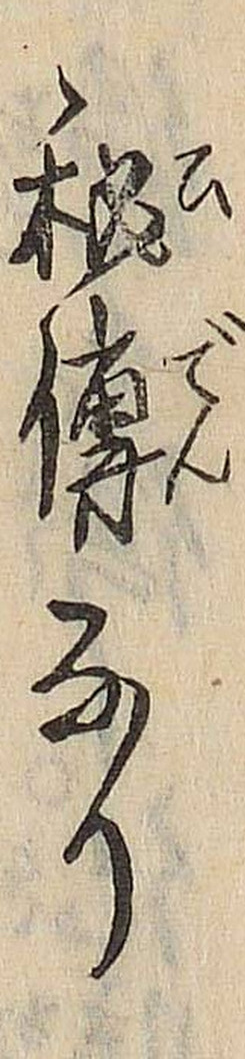秘伝なり
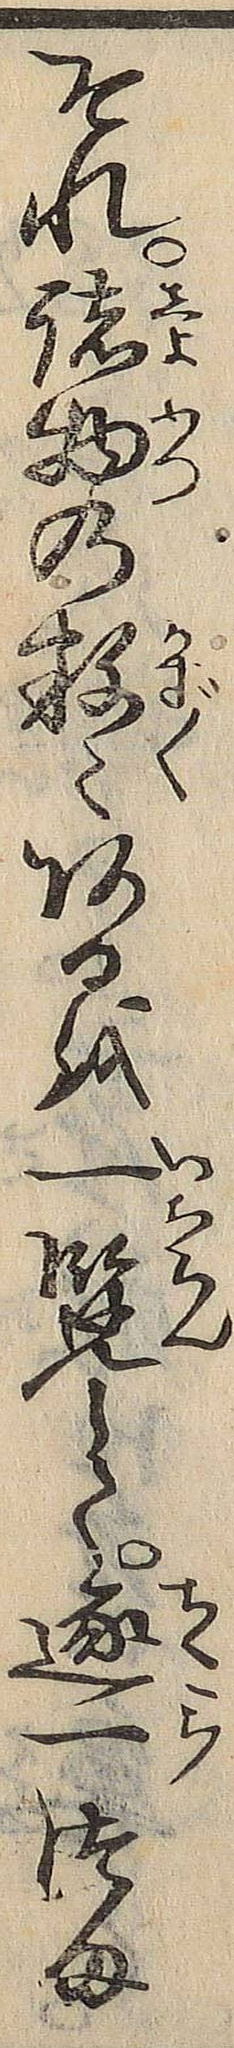それ。諸物の数々あるを一覧して。逐一つま
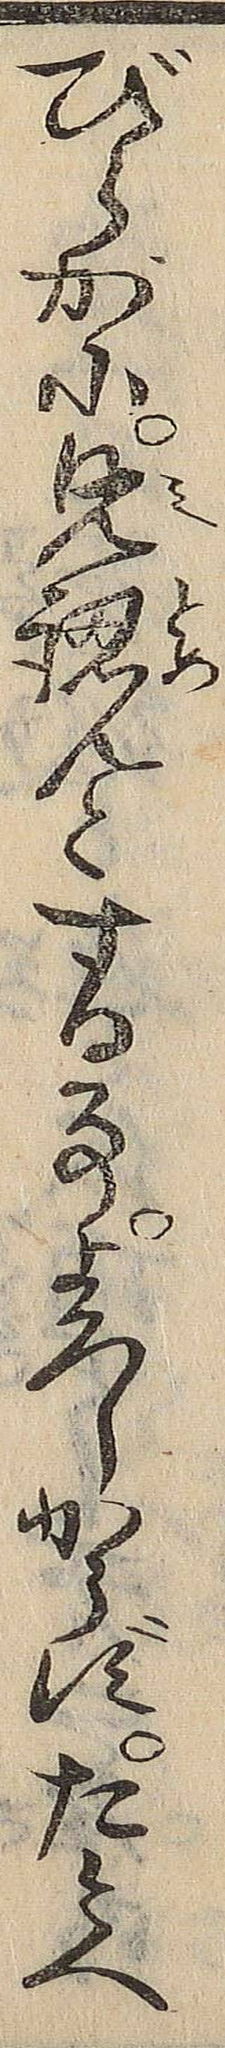びらかに。見認んとする事。よろしからず。たとへ
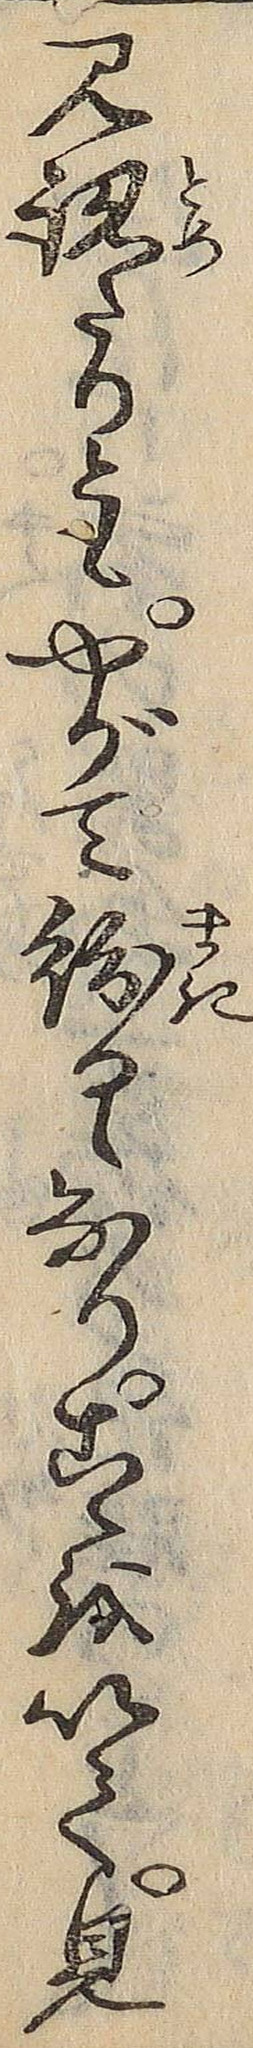見認たりとも。やがて紛るゝなり。こゝを以て。見
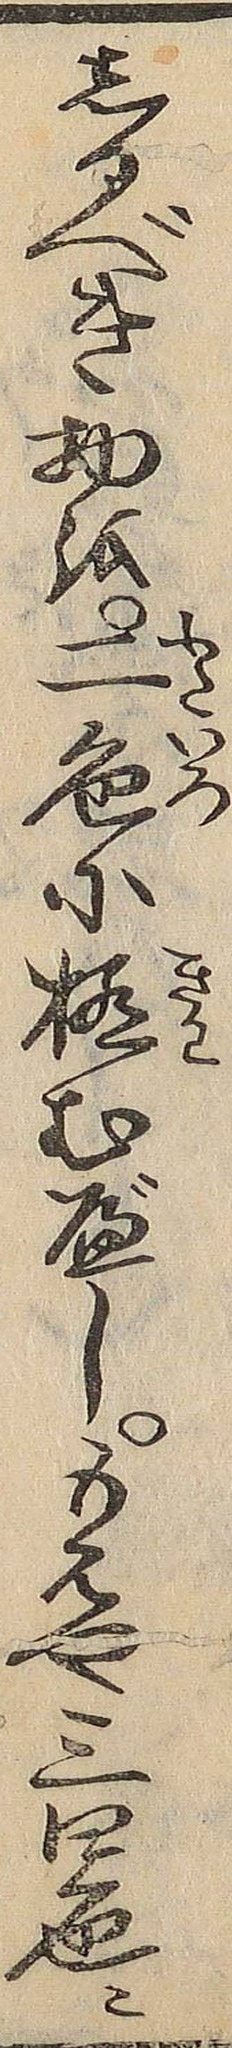しるべき物を。二色に極むべし。もはや三四色に
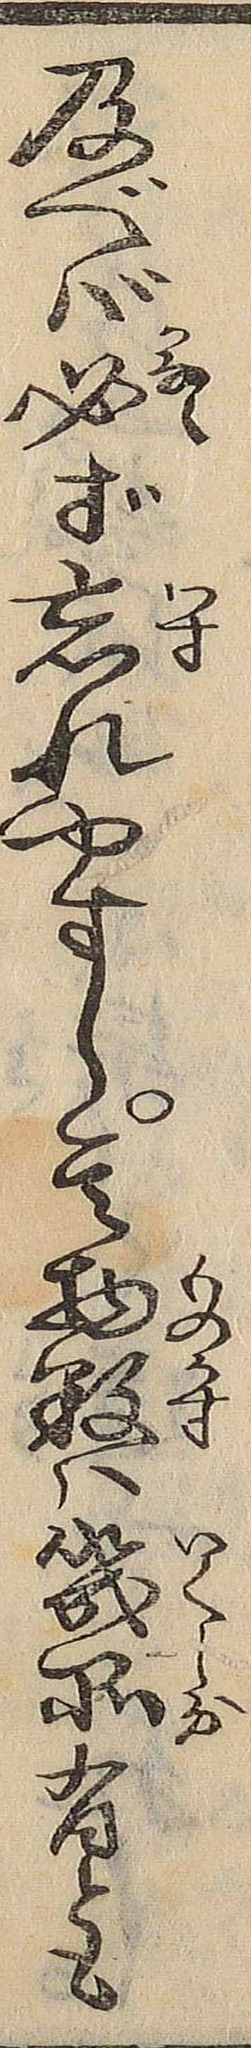及べば必ず忘れやすし。其物数は幾品有とも
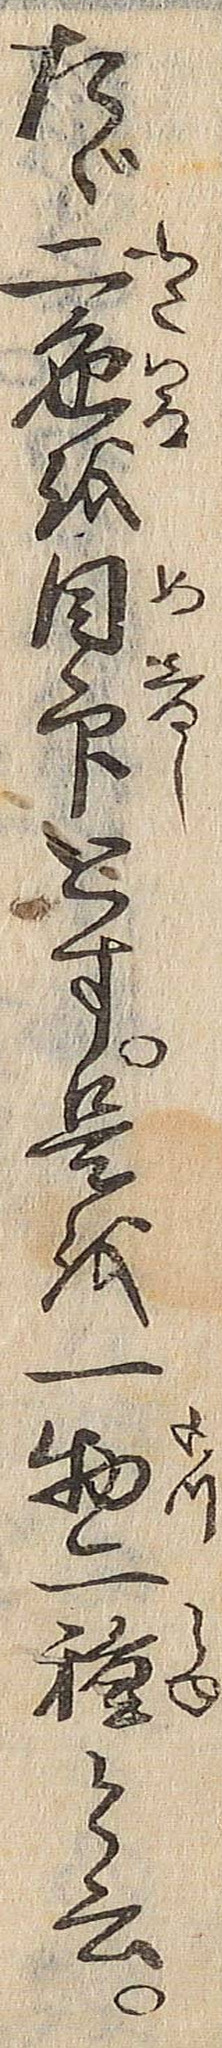たゞ二色を目印とす。是を一物二種と云。
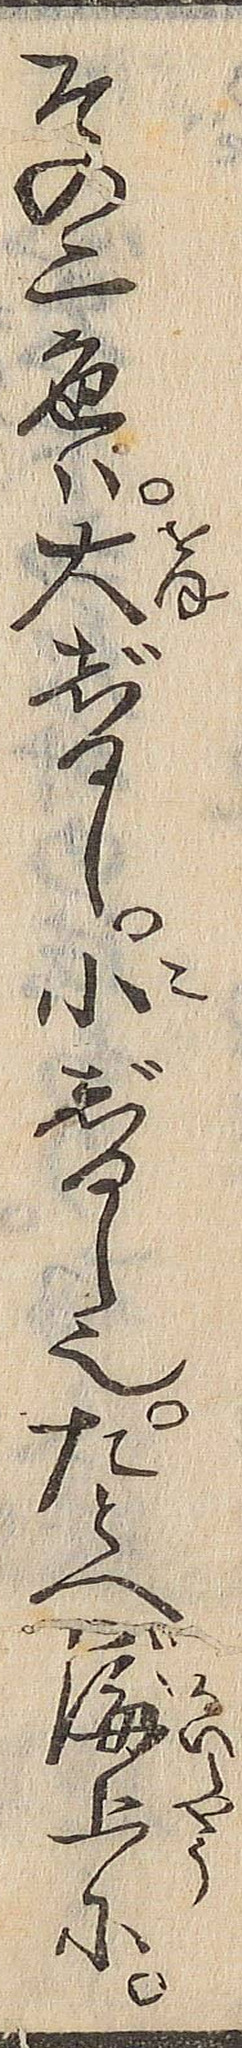その二色は。大じるし。小じるし也。たとへば海上に。
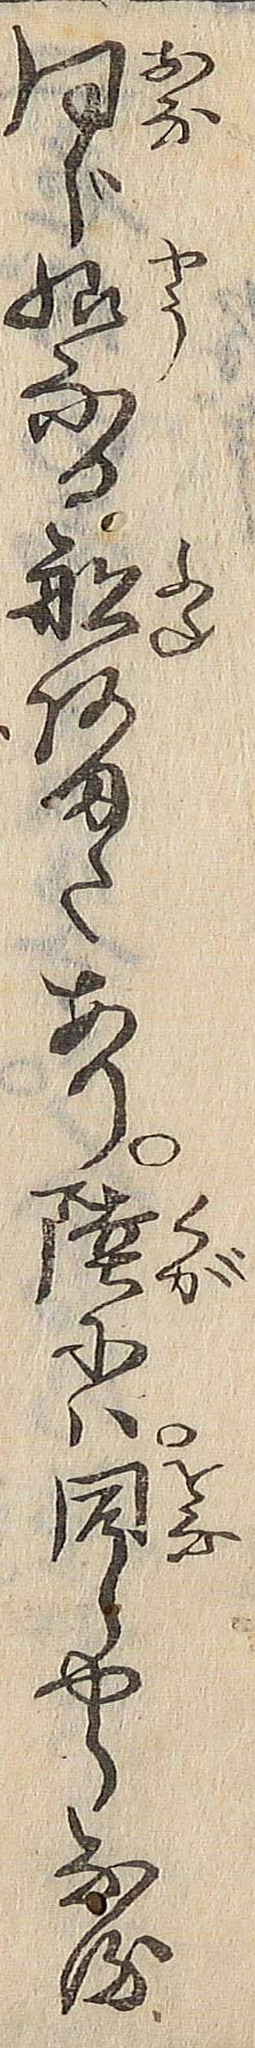同じなる船あまたあり。陸には。同しやうなる
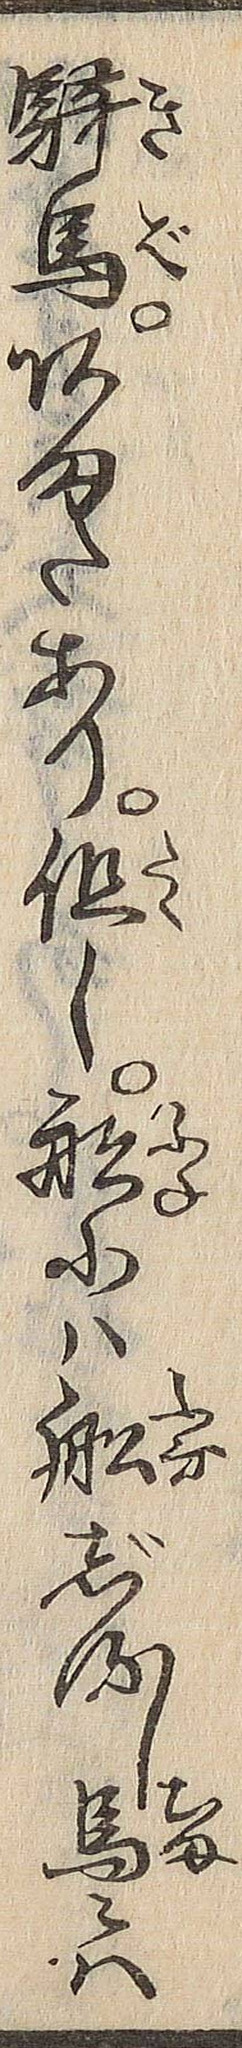騎馬。あまたあり。但し。船には船じるし馬には
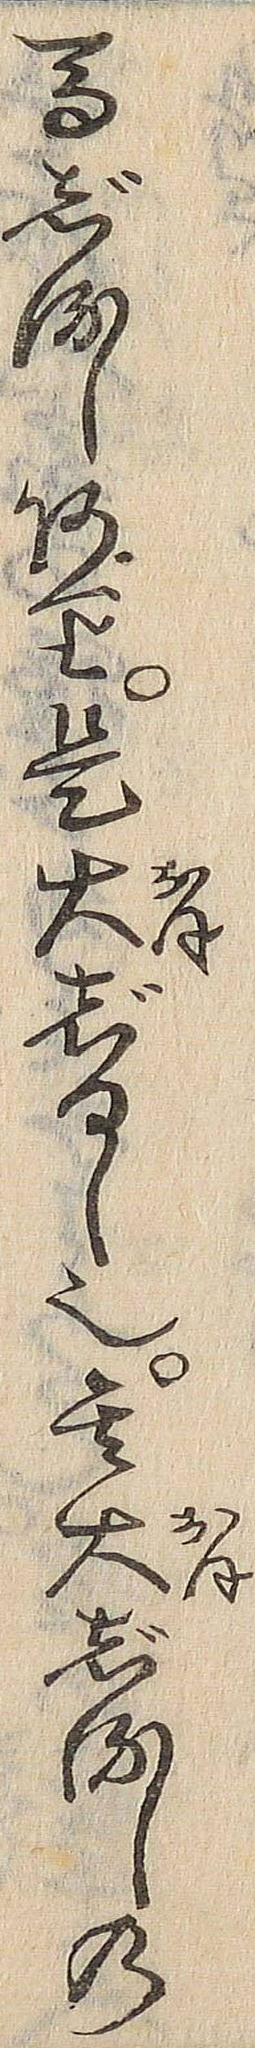馬じるしあり。是大じるし也。其大じるしの
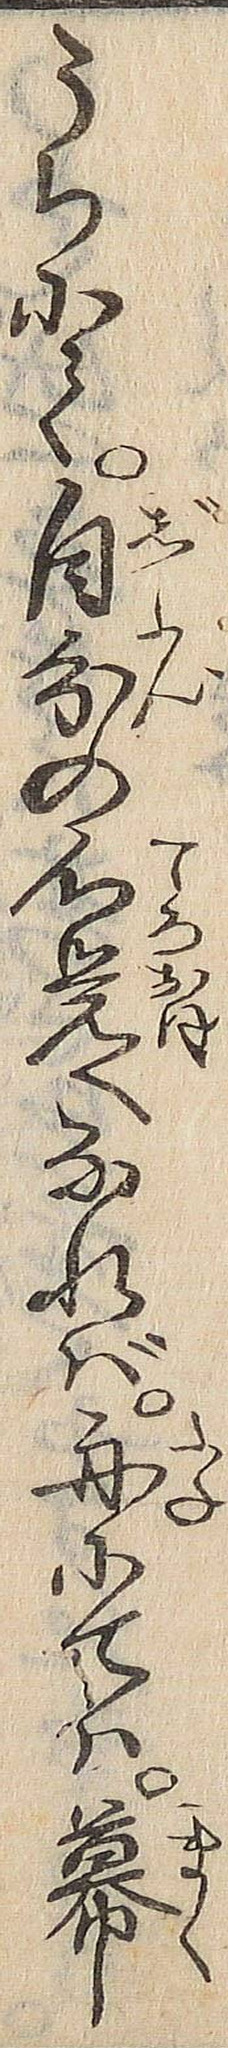うちにて。自分の心覚へなれば。舟にては。幕
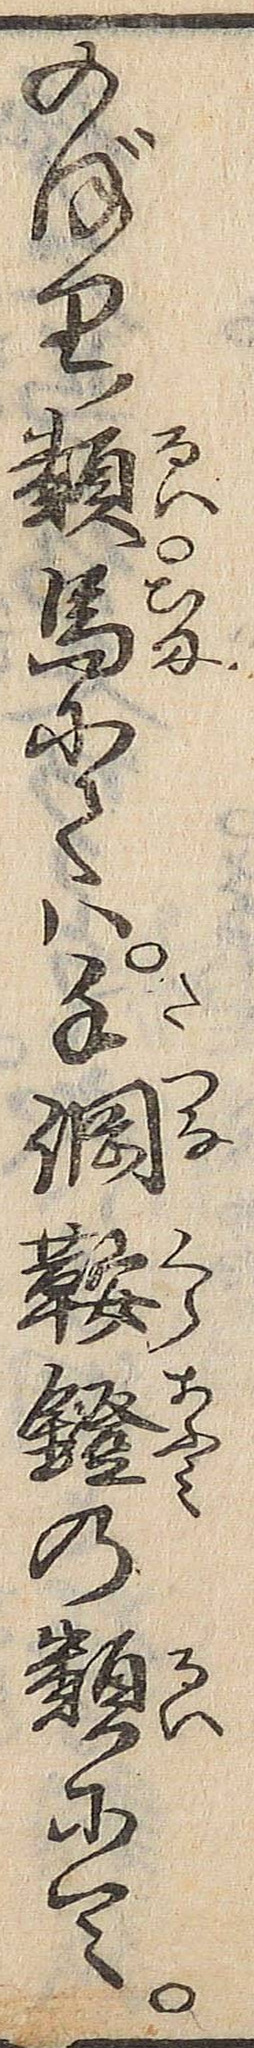のぼりの類。馬にては。手綱鞍鐙の類にて。
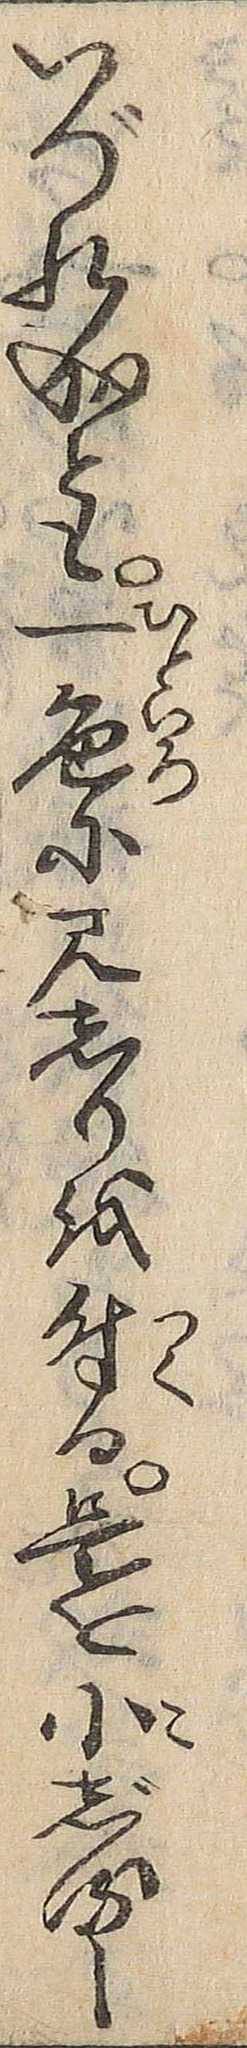いづれ成とも。一色に見しりを付る。是を小じるし

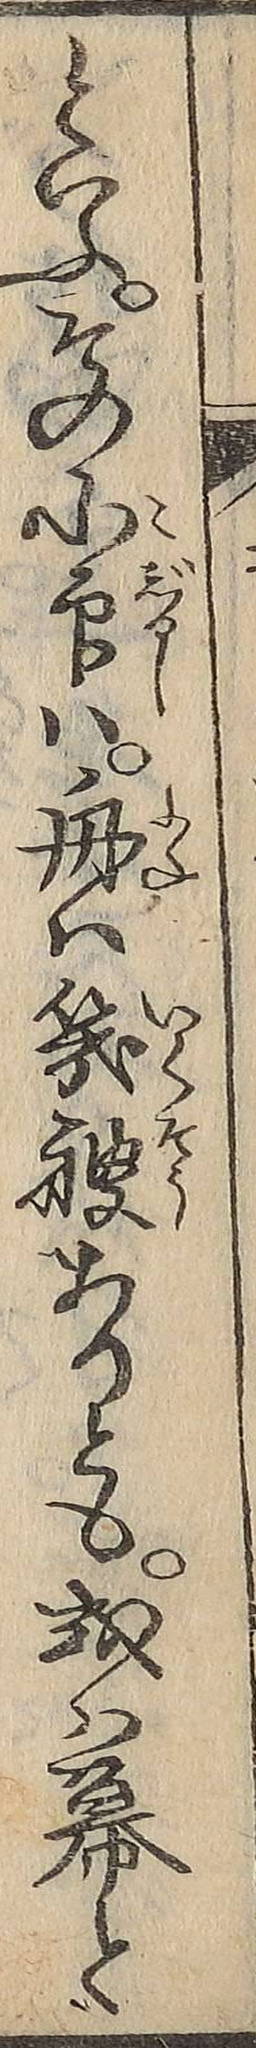といふ。その小印は。舟は幾艘ありとも。或は幕と
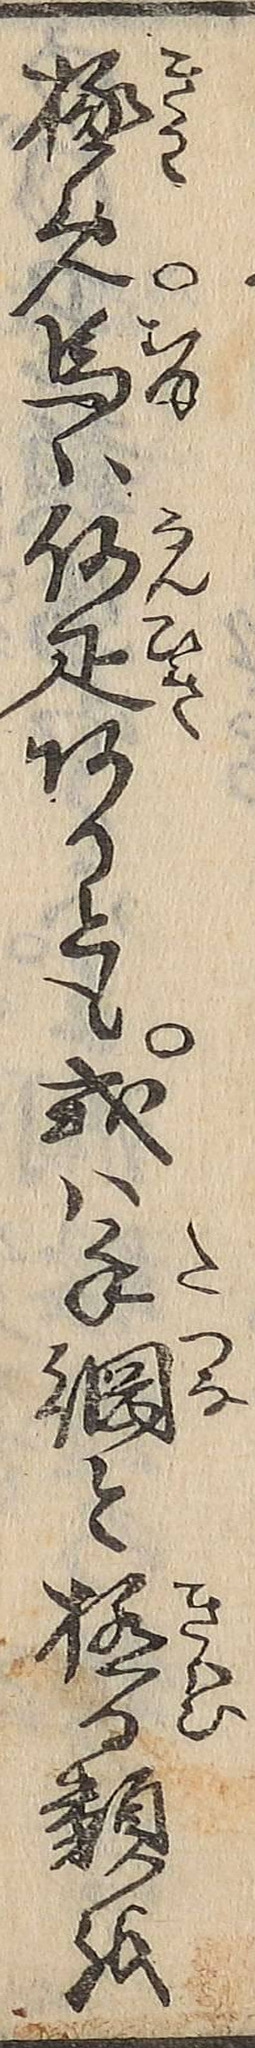極め。馬は何疋ありとも。或は手綱と極る類を
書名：物覺秘傳
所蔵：神戸大学附属図書館 国文学研究資料館
